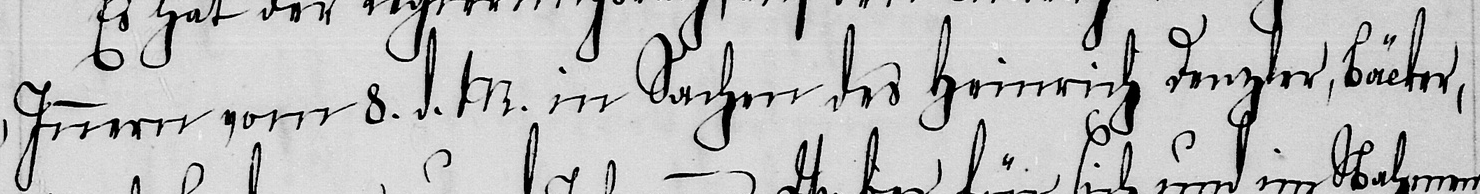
Innern vom 8. d. M. in Sachen des Heinrich Denzler, Bäcker,
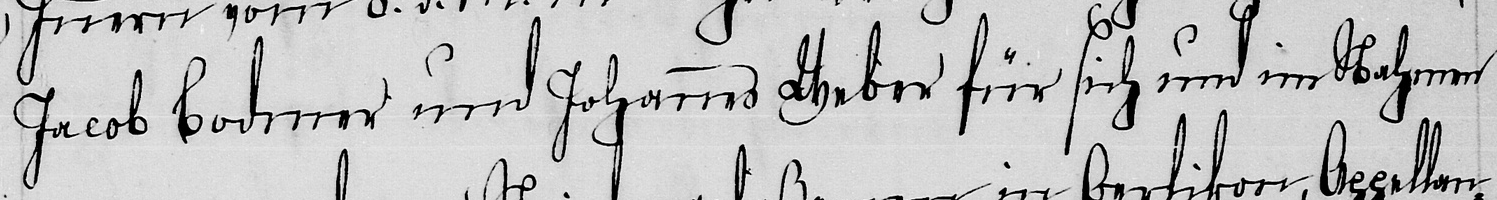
Jacob Bodmer und Johannes Weber für sich und im Nahmen
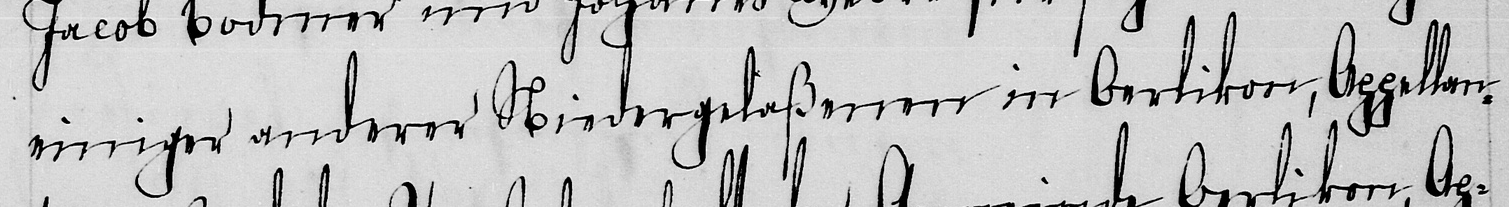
einiger anderer Niedergelaßenen in Oerlikon, Appellan¬
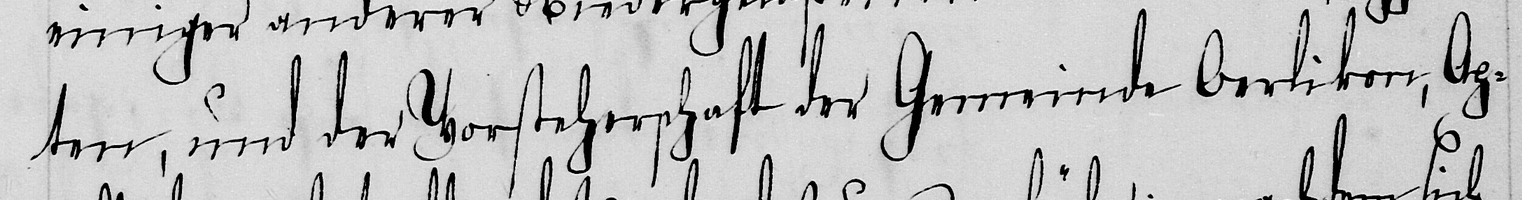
ten, und der Vorsteherschaft der Gemeinde Oerlikon, Ap¬
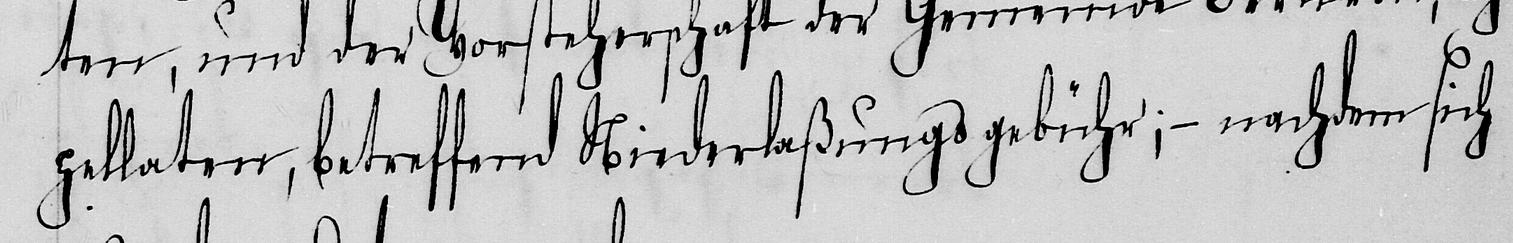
pellaten, betreffend Niederlaßungsgebühr; – nachdem sich
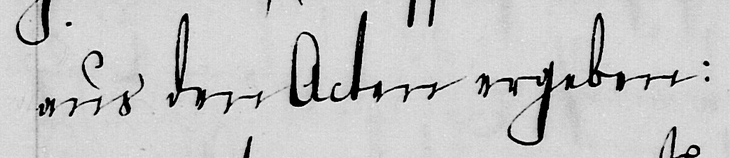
aus den Acten ergeben:
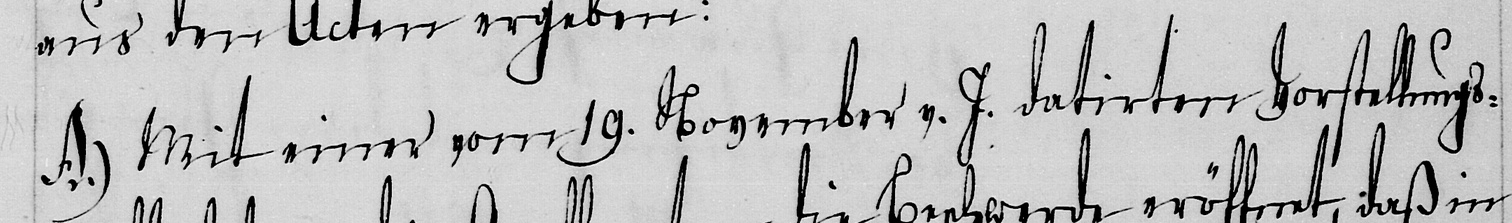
A.) Mit einer vom 19. November v. J. datirten Vorstellung¬
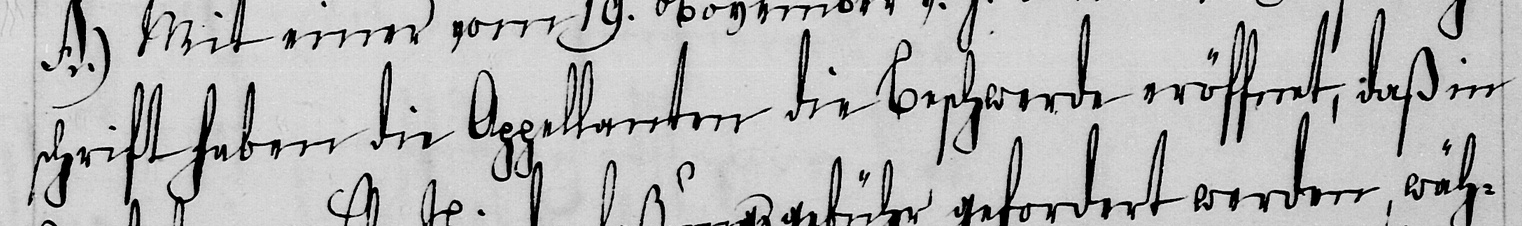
schrift haben die Appellanten die Beschwerde eröffnet, daß in
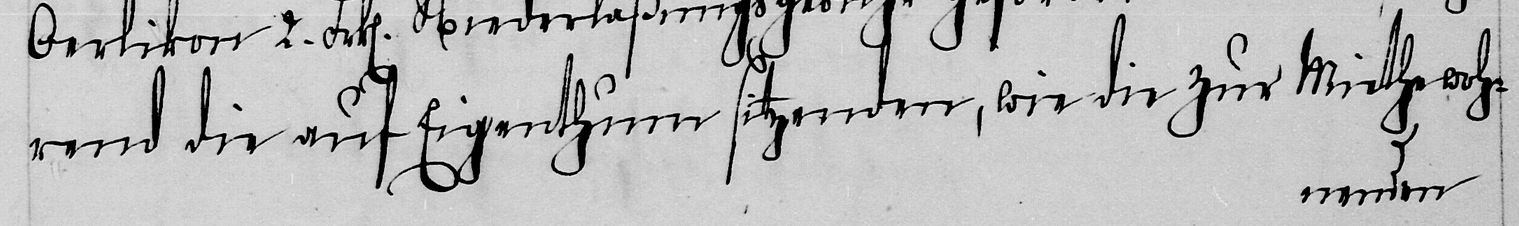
rend die auf Eigenthum sitzenden, wie die zur Miethe woh-
